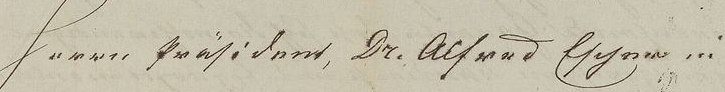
Herrn Präsident, Dr. Alfred Escher in
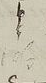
.
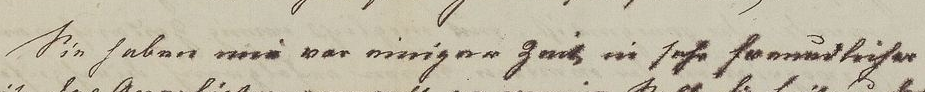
Sie haben mir vor einiger Zeit in sehr freundlicher
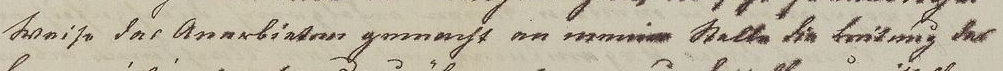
Weise das Anerbieten gemacht an meiner Stelle die Leitung des
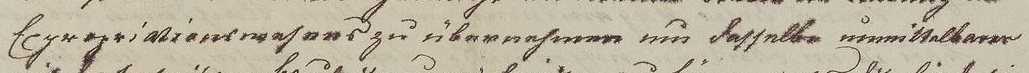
Expropriationswesens zu übernehmen um dasselbe unmittelbarer
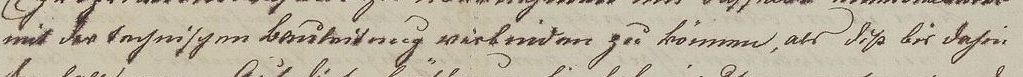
mit der technischen Bauleitung verbinden zu können, als diß bis dahin
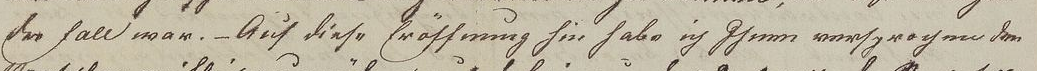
der Fall war. – Auf diese Eröffnung hin habe ich Ihnen versprochen den
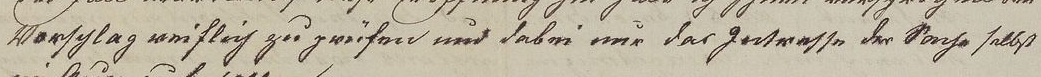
Vorschlag reiflich zu prüfen und dabei nur das Intresse der Sache selbst
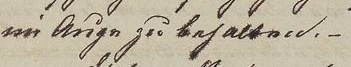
im Auge zu behalten. –
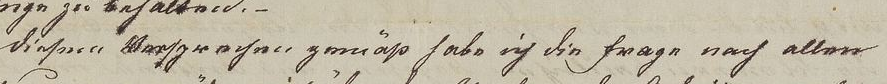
Diesem Versprechen gemäß habe ich die Frage nach allen
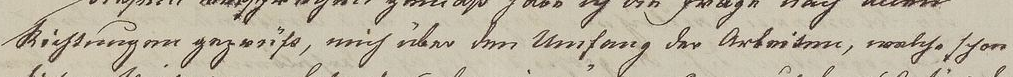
Richtungen geprüft, mich über den Umfang der Arbeiten, welche schon
